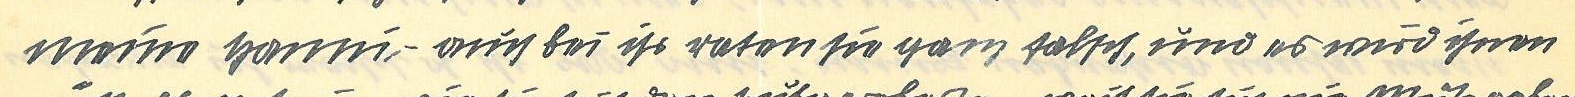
meine , – auch bei ihr raten sie ganz falsch, und es wird ihnen
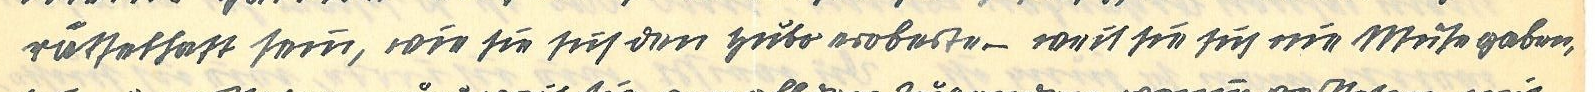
rätselhaft sein, wie sie sich den Hubo eroberte – weil sie sich nie Mühe gaben,
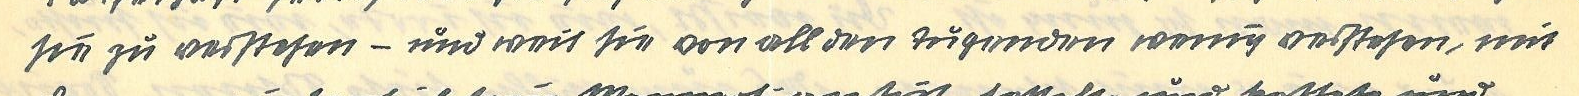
sie zu verstehen – und weil sie von all den Tugenden wenig verstehen, mit
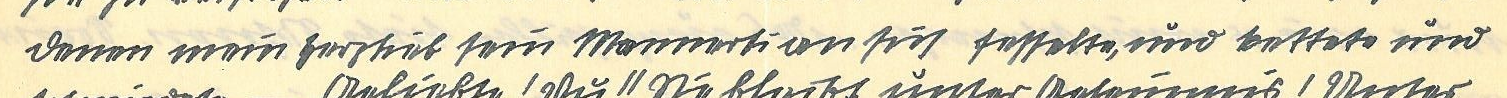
denen mein Herzlieb sein Mannerli an sich fesselte, und kettete und
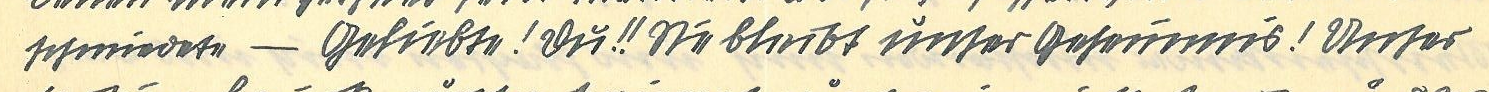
schmiedete — Geliebte! Du!! Sie bleibt unser Geheimnis! Unser
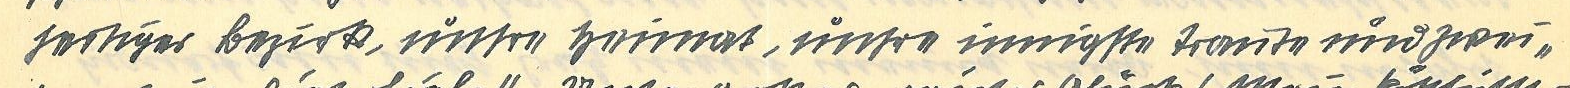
heiliger Bezirk, unsre Heimat, unsre innigste Traute und Zwei¬
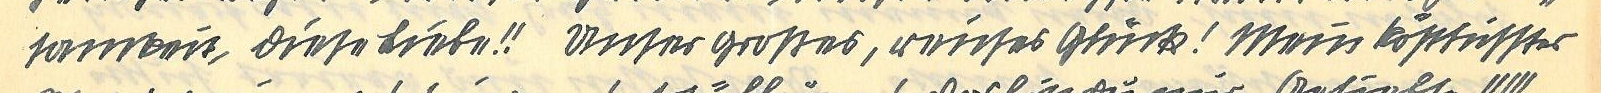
samkeit, diese Liebe!! Unser großes, reiches Glück! Mein köstlichster
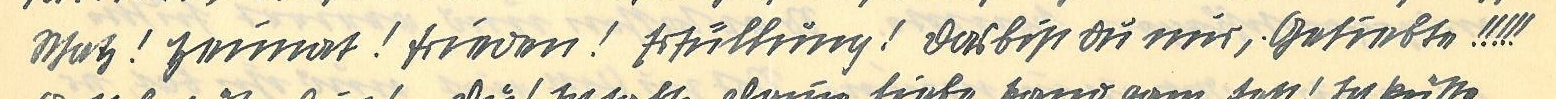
Platz! Heimat! Frieden! Erfüllung! Das bist Du mir, Geliebte!!!!!
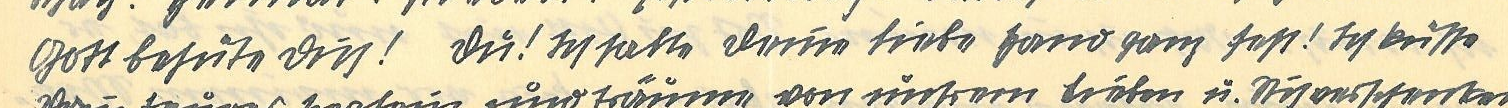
Gott behüte Dich! Du! Ich halte Deine liebe Hand ganz fest! Ich küsse
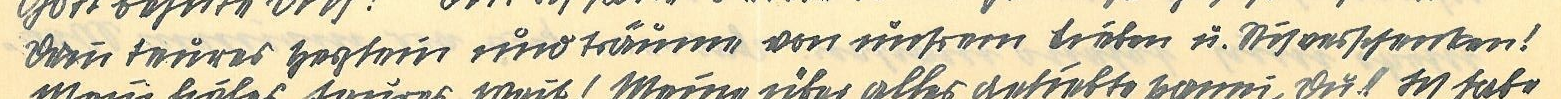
Dein teures Herzlein und träume von unsrem Lieben u. Sichverschenken!
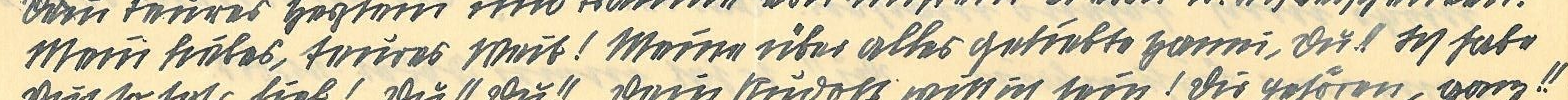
Mein liebes, teures Weib! Meine über alles geliebte , Du!! Ich habe
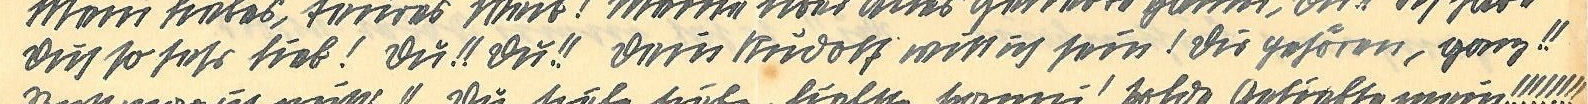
Dich so sehr lieb! Du!! Du!! Dein will ich sein! Dir gehören, ganz!!
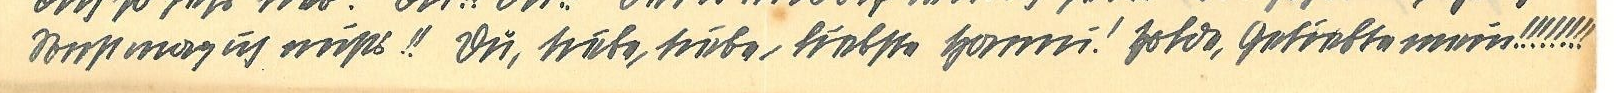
Sonst mag ich nichts!! Du, liebe, liebe, liebste Holde, Geliebte mein!!!!!!!!
